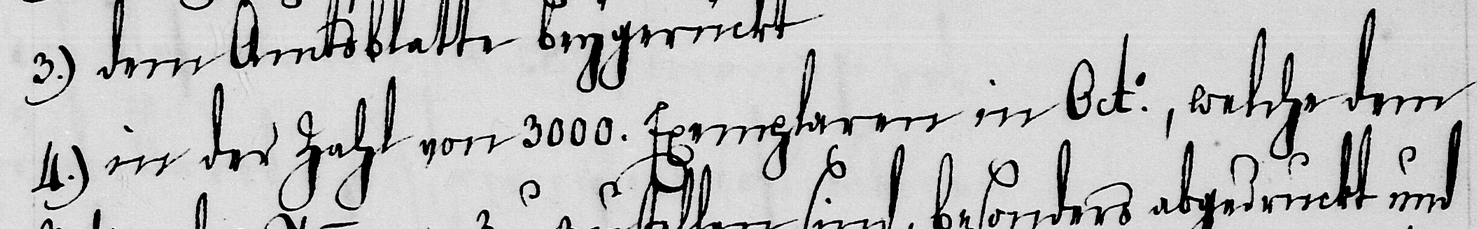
4.) in der Zahl von 3000. Exemplaren in Octo., welche dem
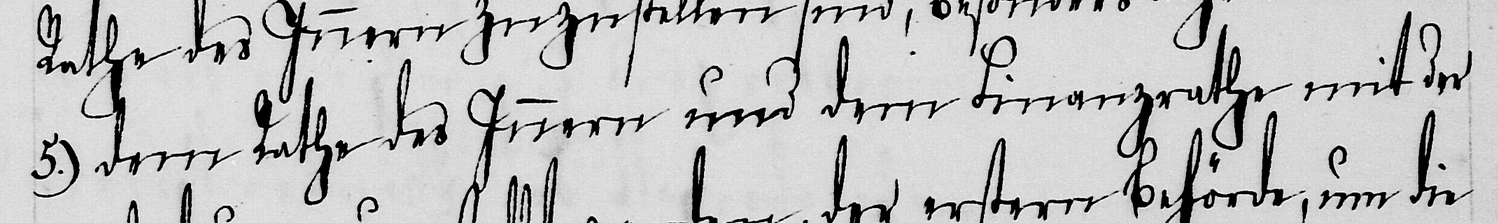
5.) dem Rathe des Innern und dem Finanzrathe mit der
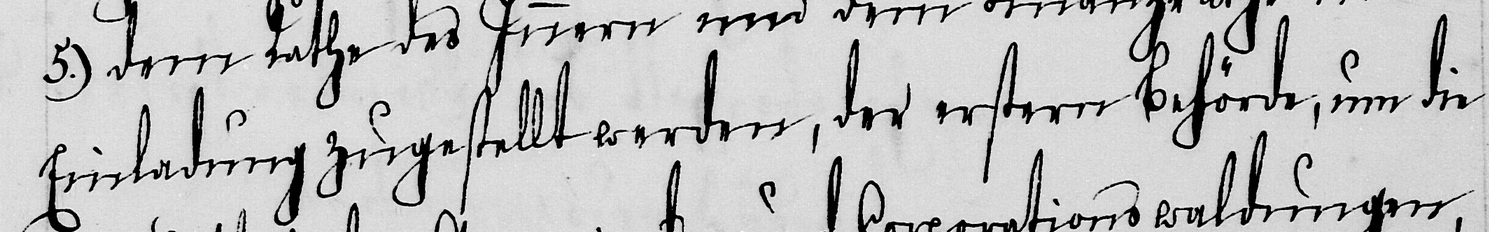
Einladung zugestellt werden, der erstern Behörde, um die
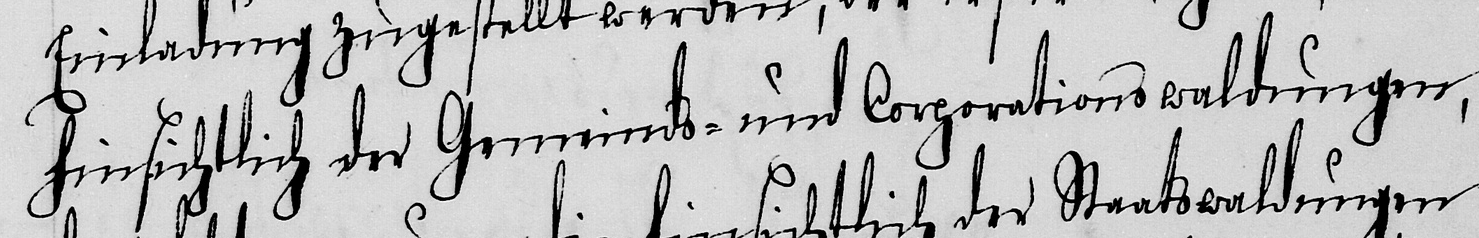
hinsichtlich der Gemeinds- und Corporationswaldungen,
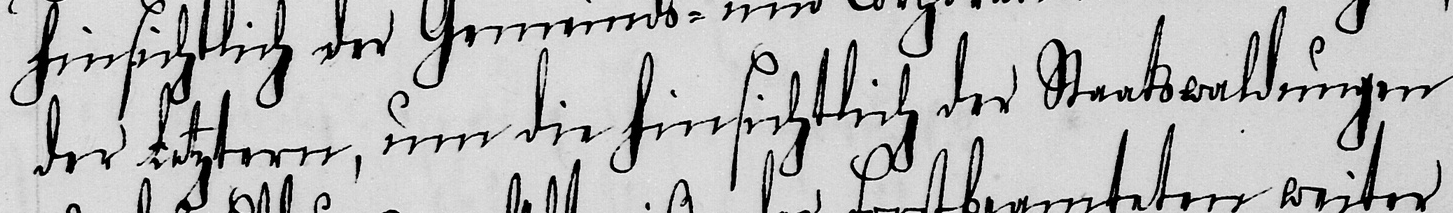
der Letztern, um die hinsichtlich der Staatswaldungen
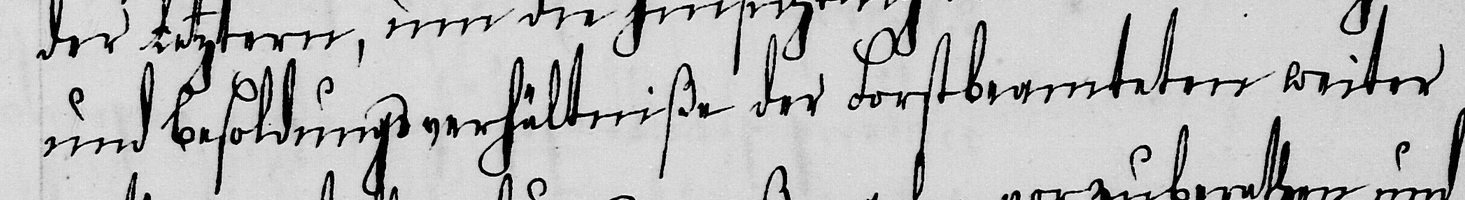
und Besoldungsverhältniße der Forstbeamteten weiter
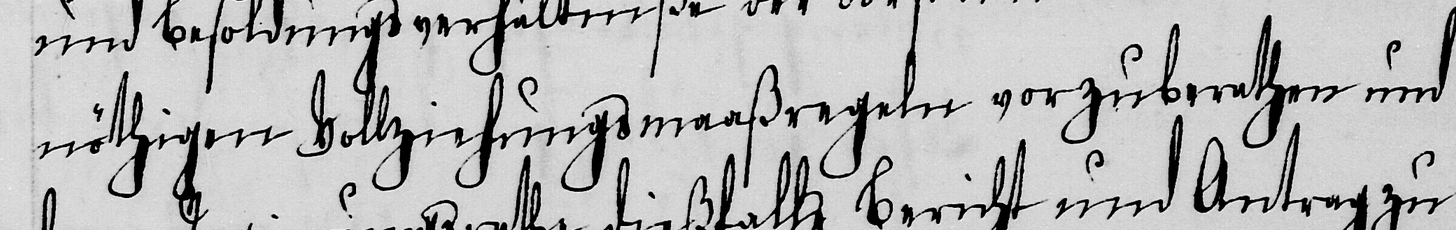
nöthigen Vollziehungsmaaßregeln vorzuberathen und
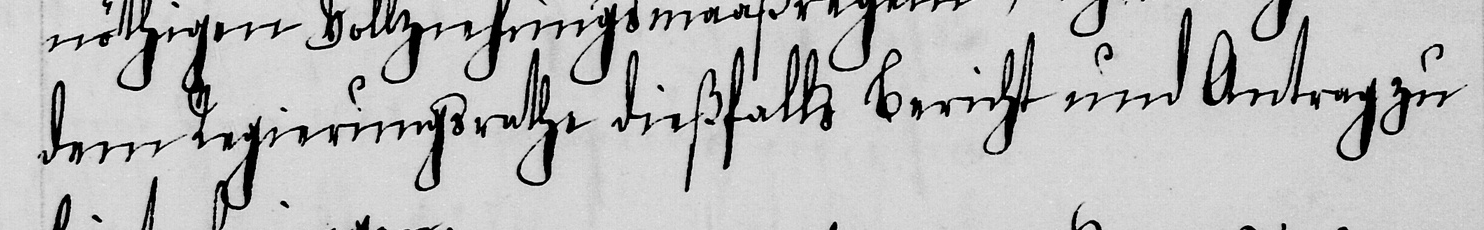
dem Regierungsrathe dießfalls Bericht und Antrag zu
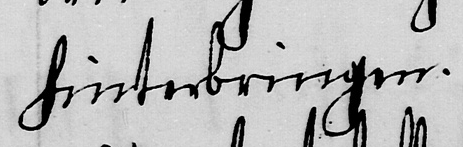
hinterbringen.
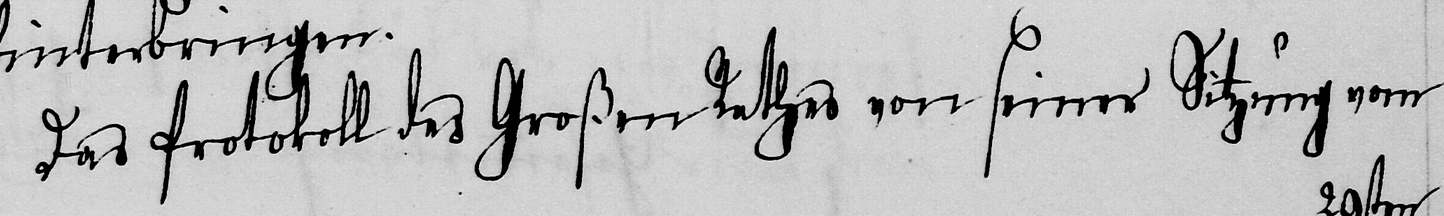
Das Protokoll des Großen Rathes von seiner Sitzung vom
